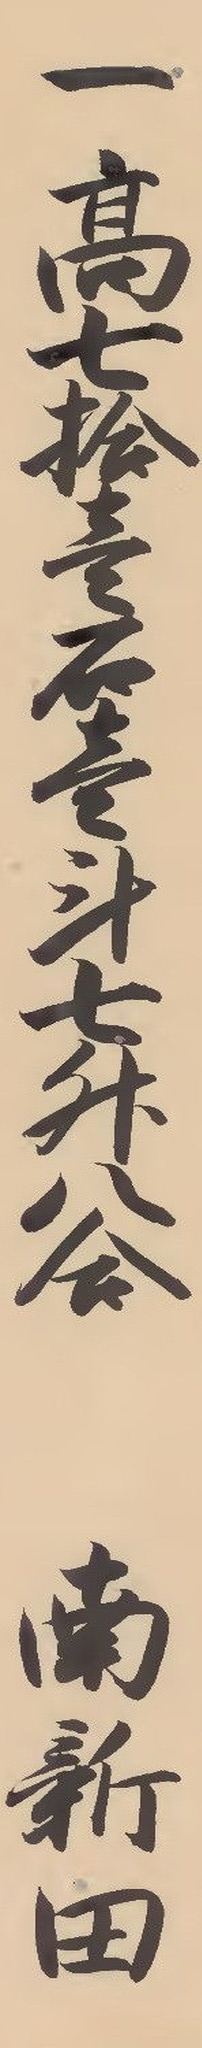一高七拾壱石壱斗七升八合南新田
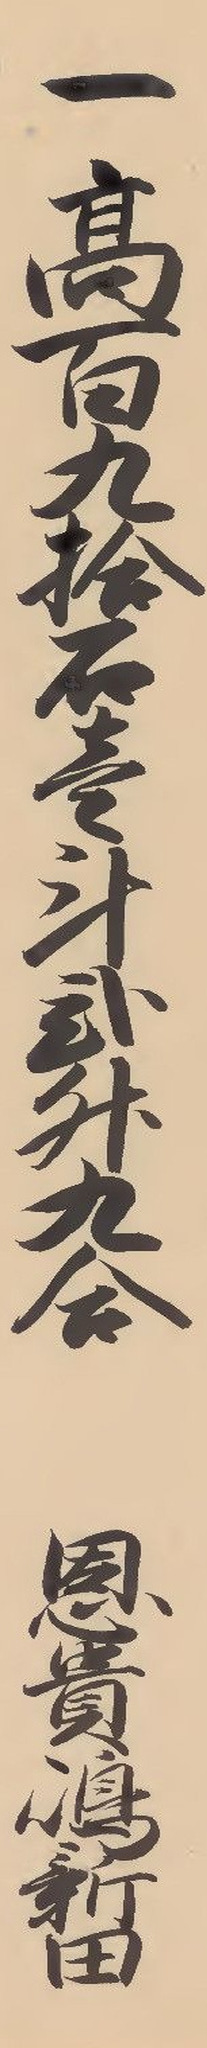一高百九拾石壱斗弐升九合恩貴島新田
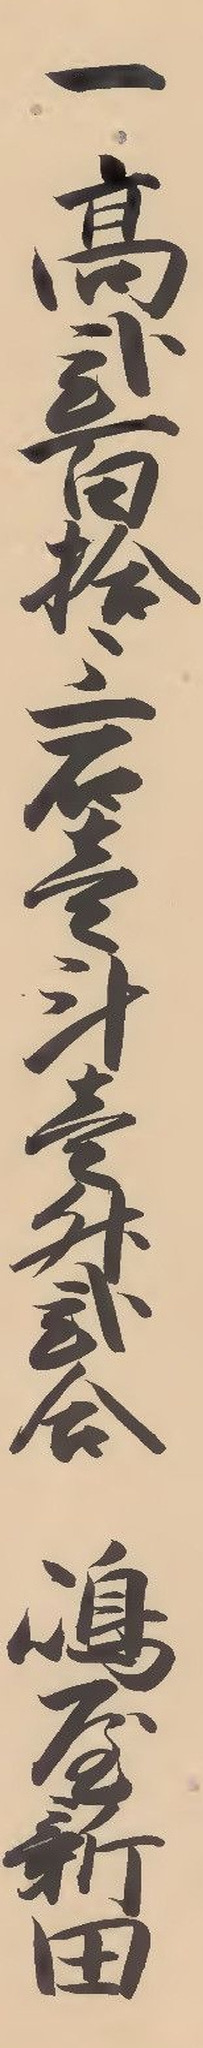一高弐百拾三石壱斗壱升弐合島屋新田
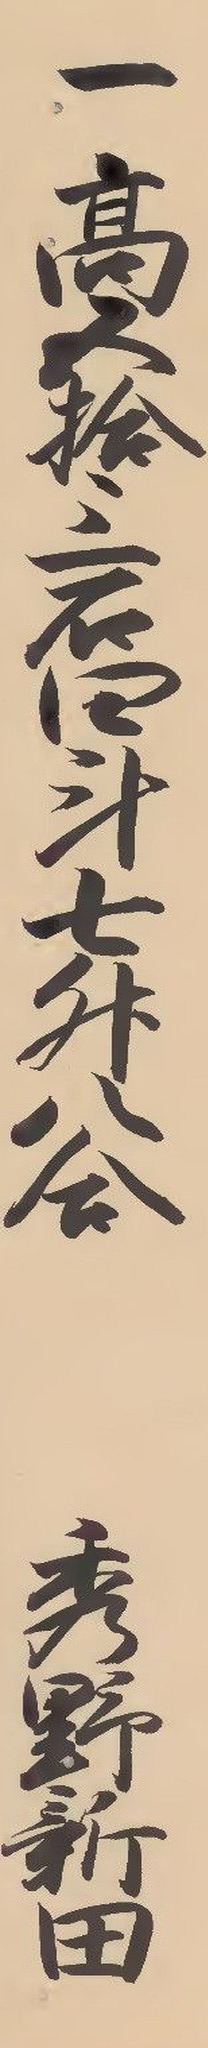一高五拾三石四斗七升八合秀野新田
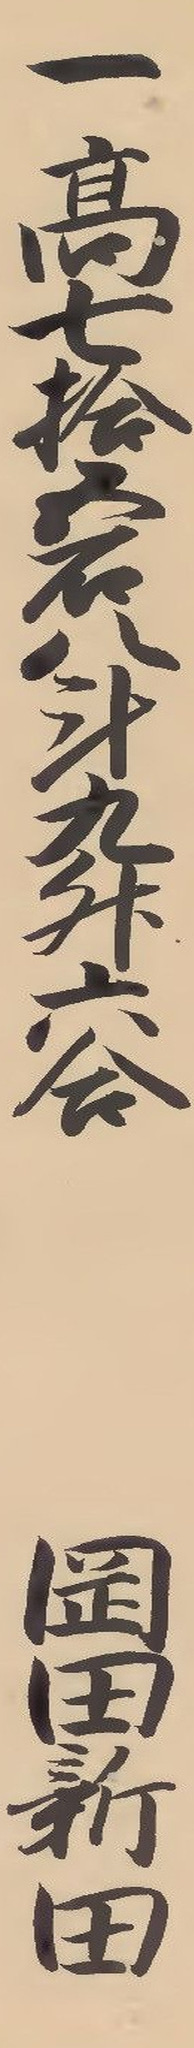一高七拾五石八斗九升六合岡田新田
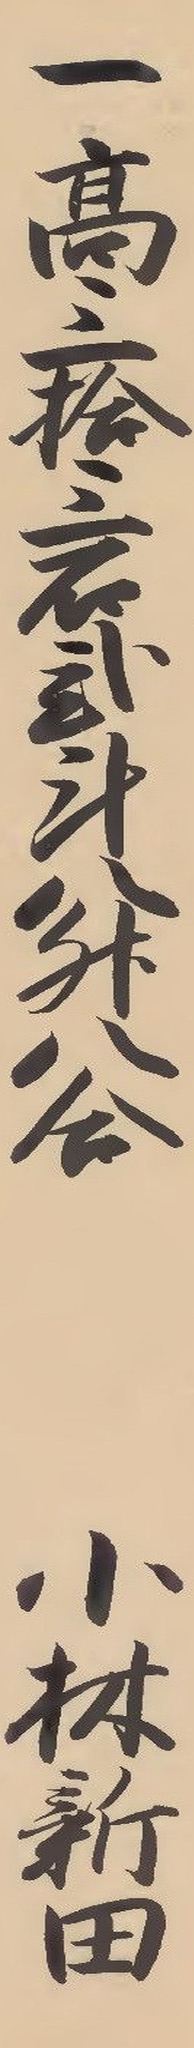一高三拾三石弐斗八升八合小林新田
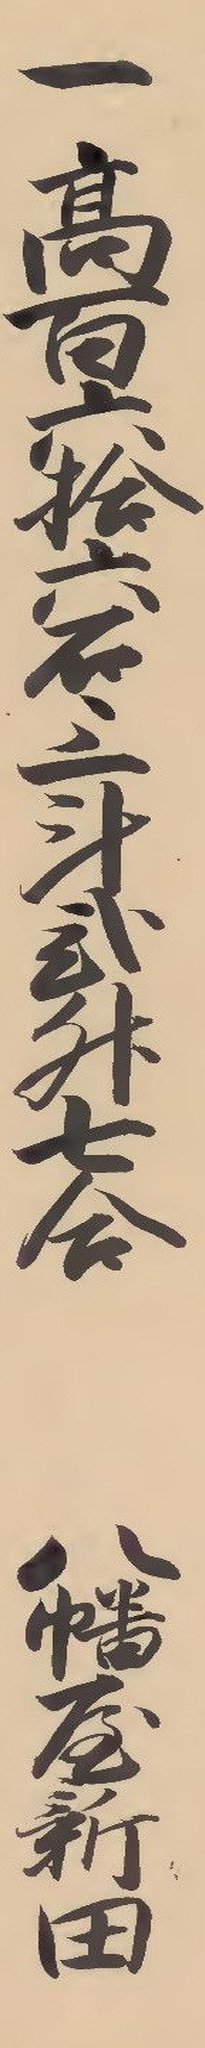一高百六拾六石三斗弐升七合八幡屋新田
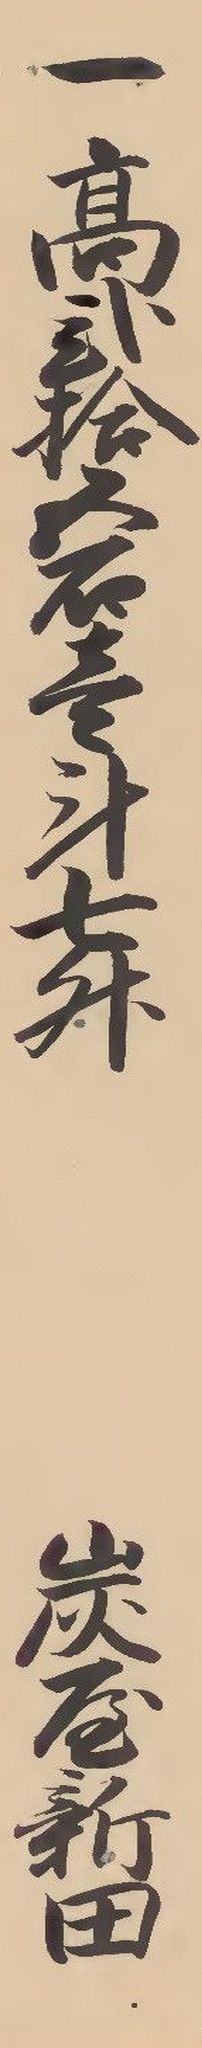一高弐拾五石壱斗七升炭屋新田

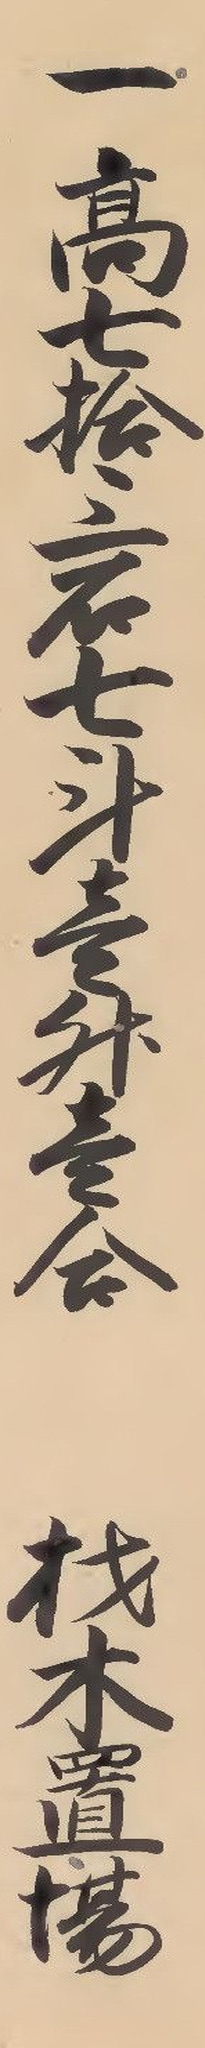一高七拾三石七斗壱升壱合材木置場
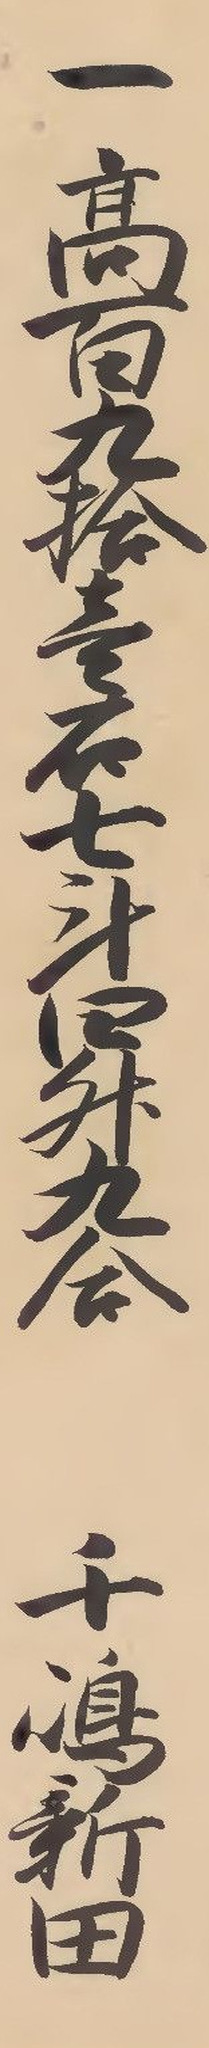一高百九拾壱石七斗四升九合千島新田
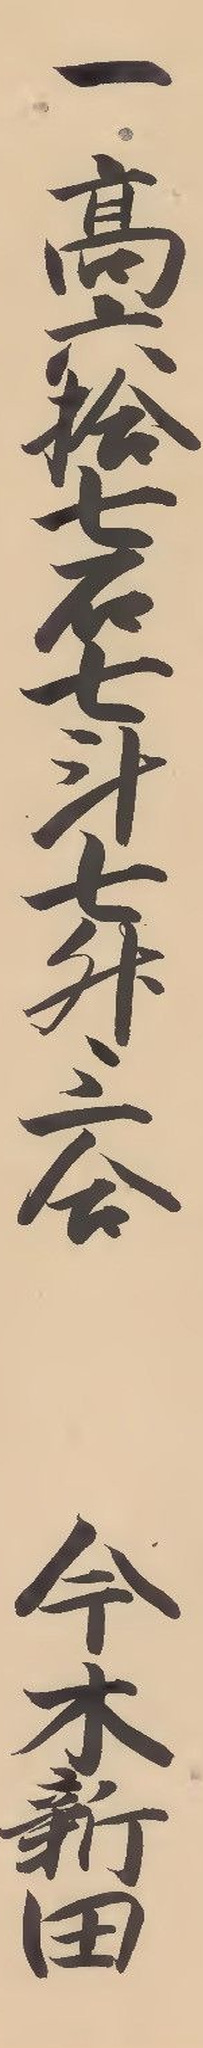一高六拾七石七斗七升三合今木新田
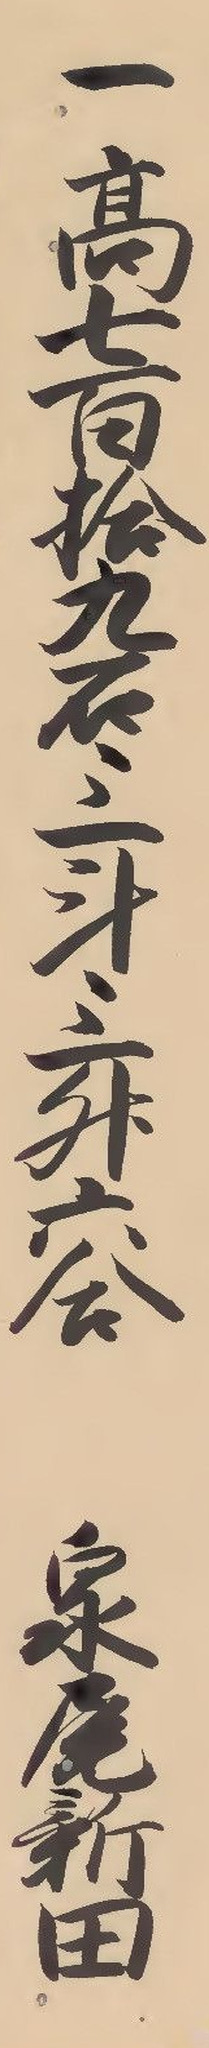一高七百拾九石三斗三升六合泉尾新田
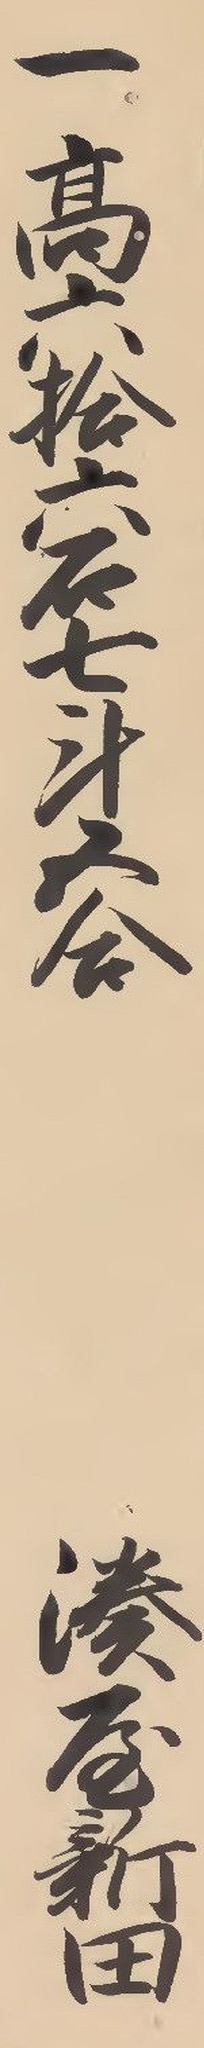一高六拾六石七斗五合湊屋新田
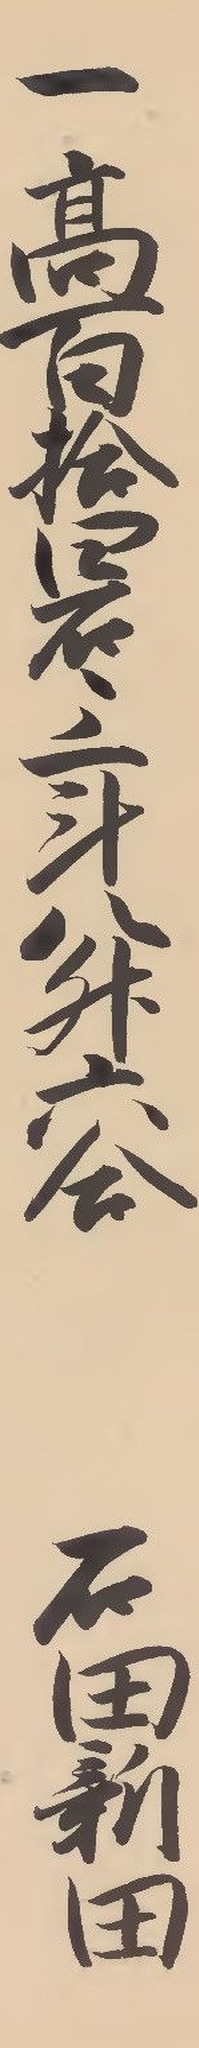一高百拾四石三斗八升六合石田新田
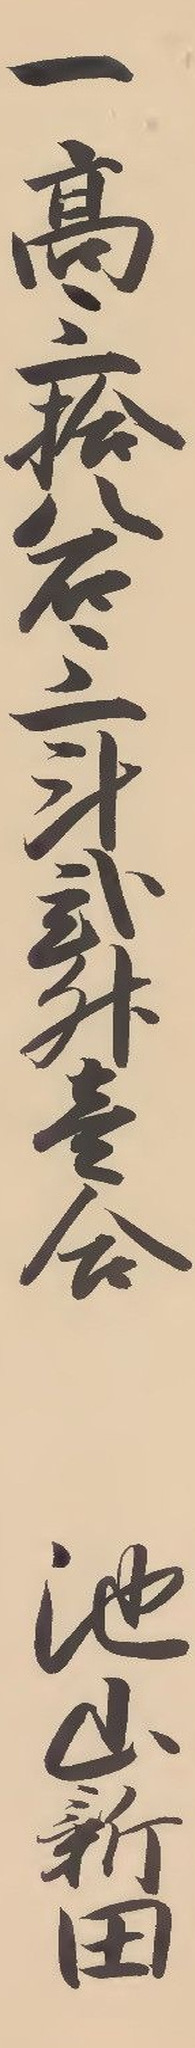一高三拾八石三斗弐升壱合池山新田
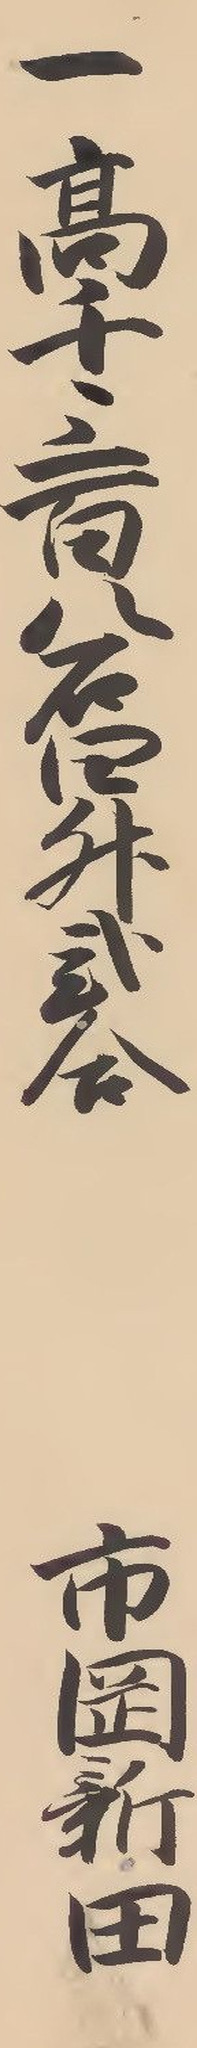一高千三百八石四升弐合市岡新田
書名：摂津国郷帳
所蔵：国立公文書館 National Archives of Japan
